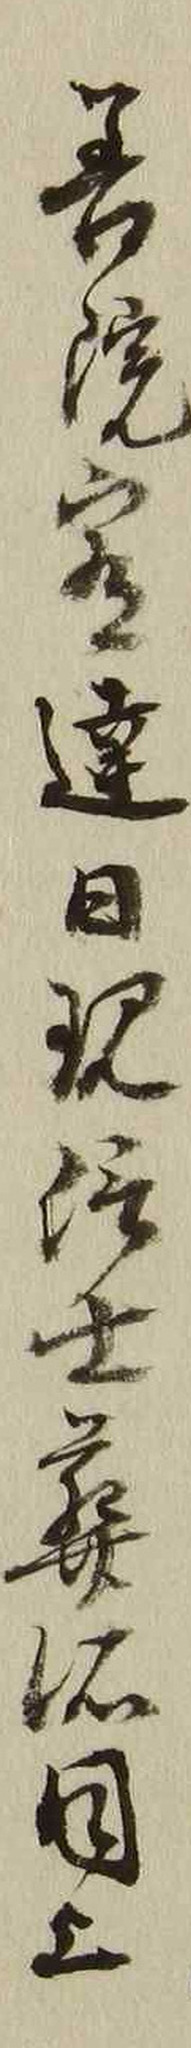善院宥達日現信士葬所同上
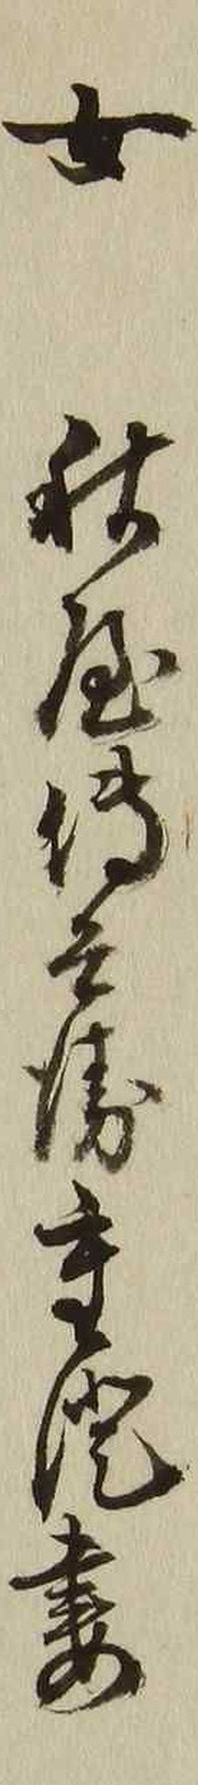女秋屋伝兵衛重證妻
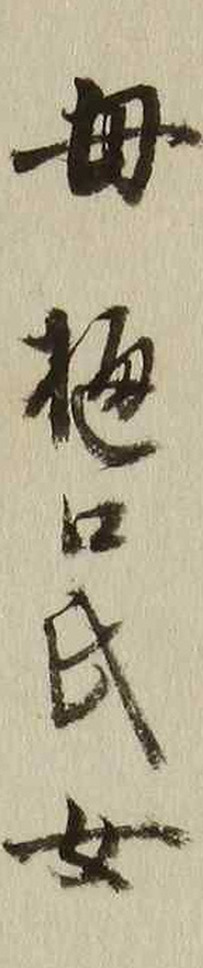母樋口氏女
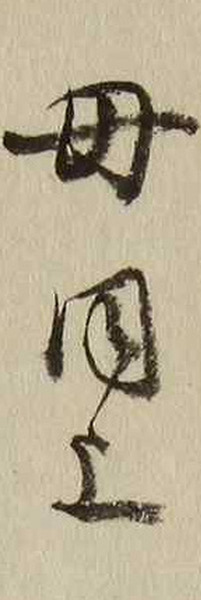母同上
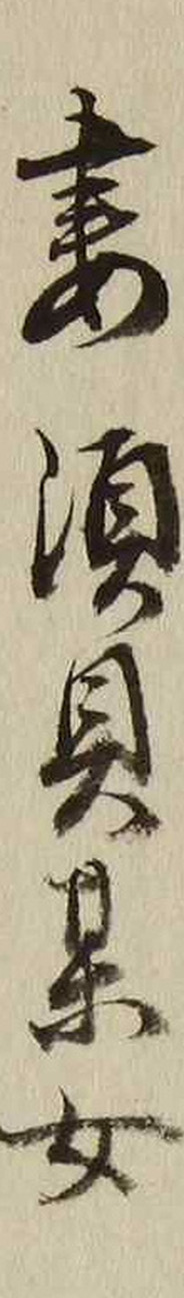妻須貝某女
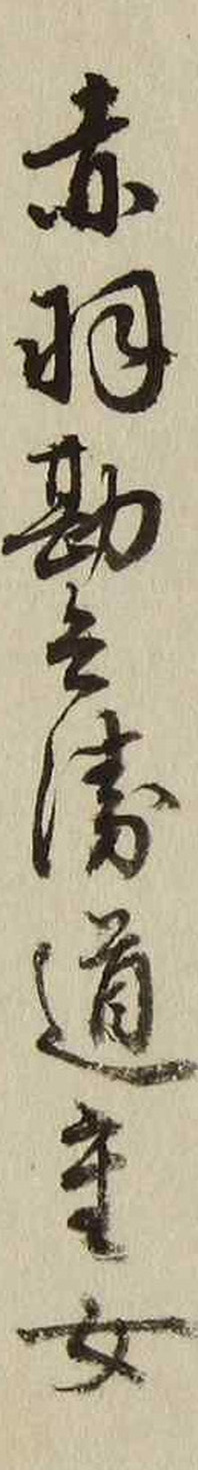赤羽勘兵衛道重女
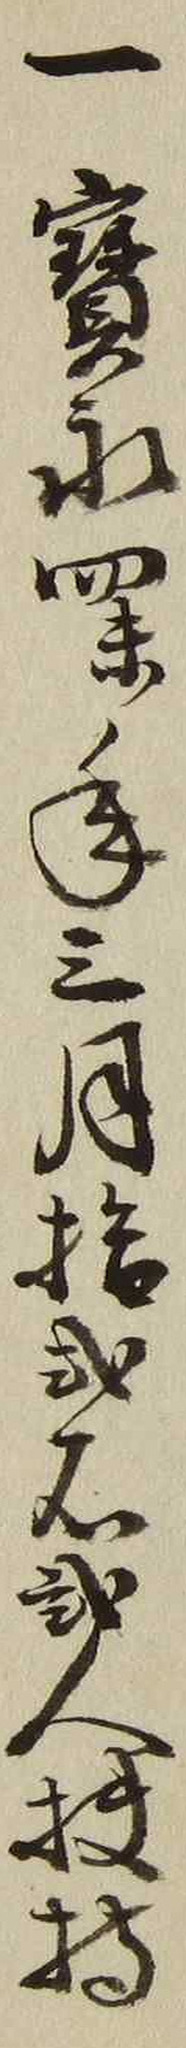一宝永四未年三月拾弐石弐人扶持
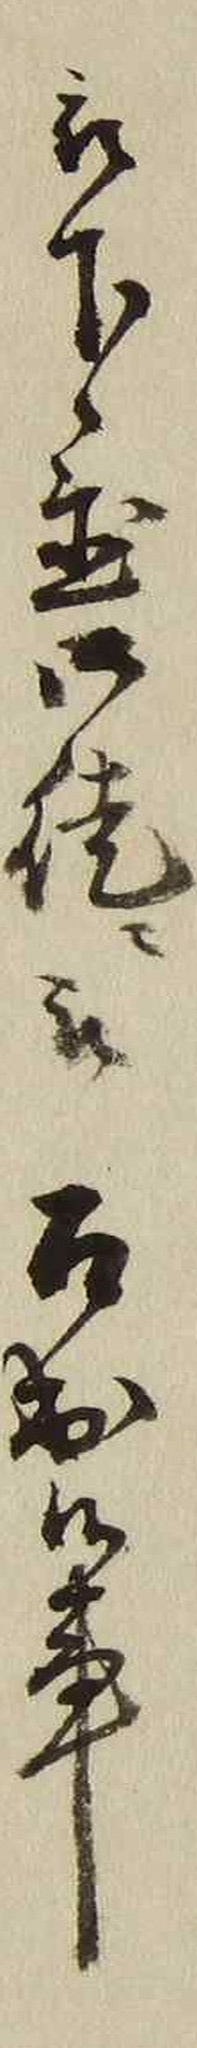被下候置御徒に被召出候事
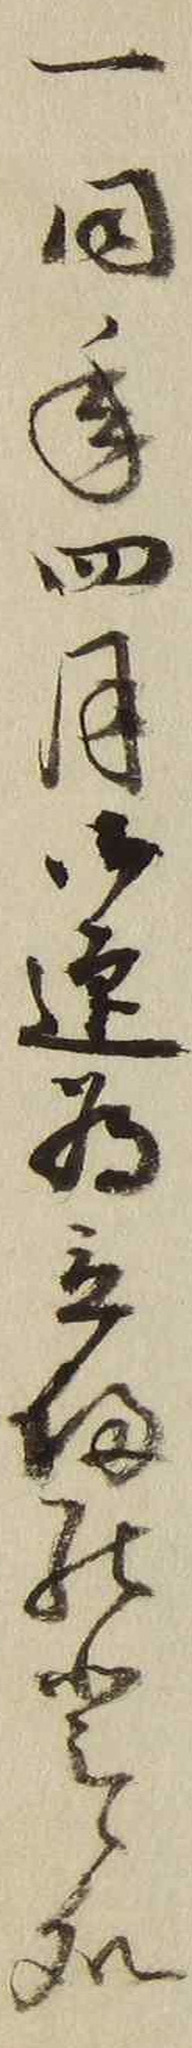一同年四月御迎為立帰罷登候処

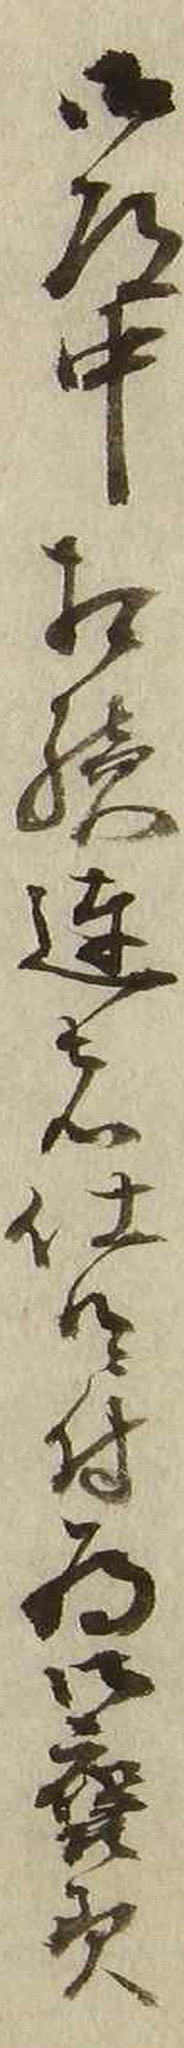御道中相続達者仕候に付為褒美
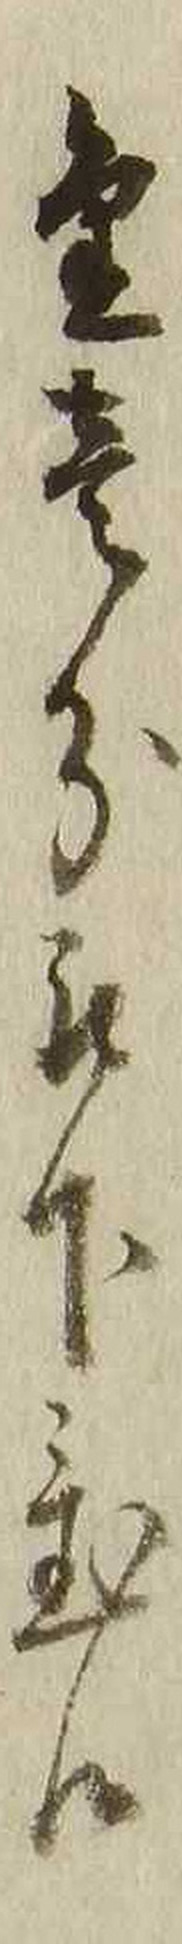金壱分被下置候
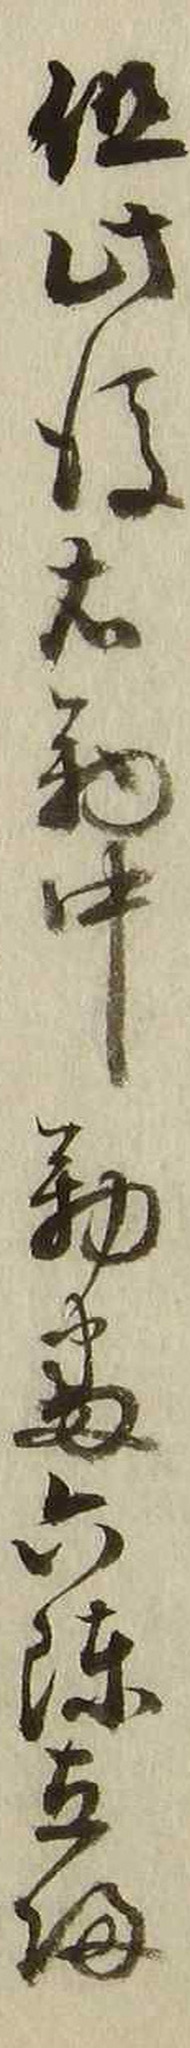但此呉後右勤中勤番六陣立帰
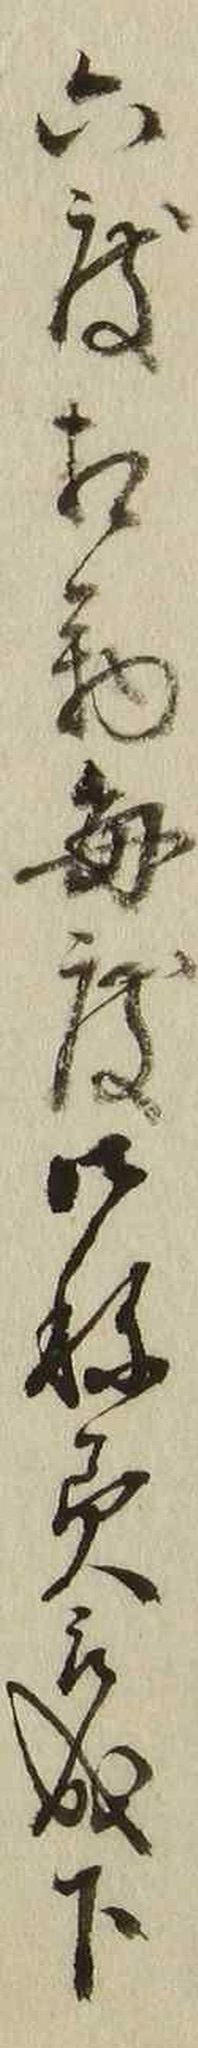六度相勤毎度御称美被成下
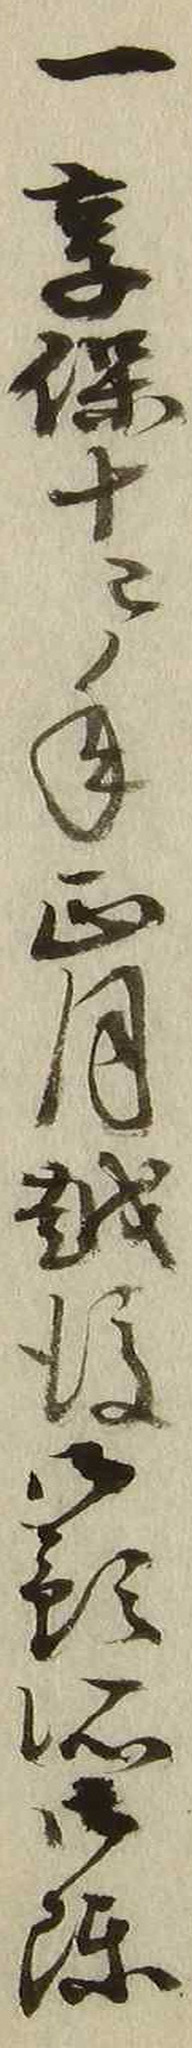一享保十巳年正月越後御預所御陣
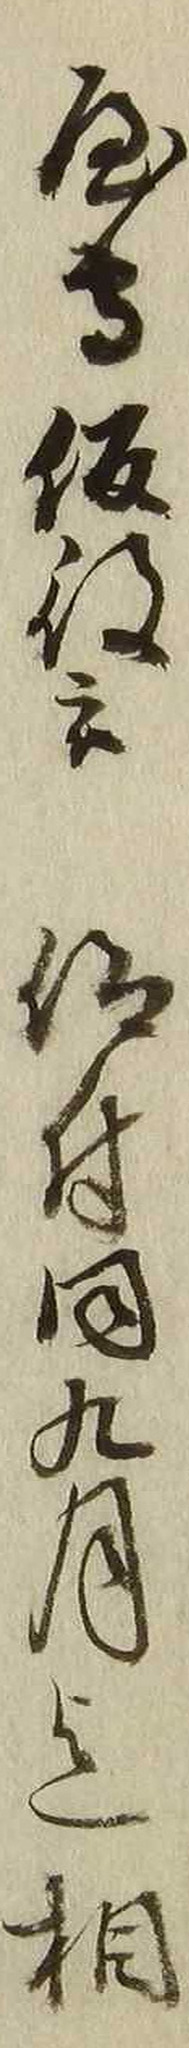屋守仮役被仰付同九月迄相
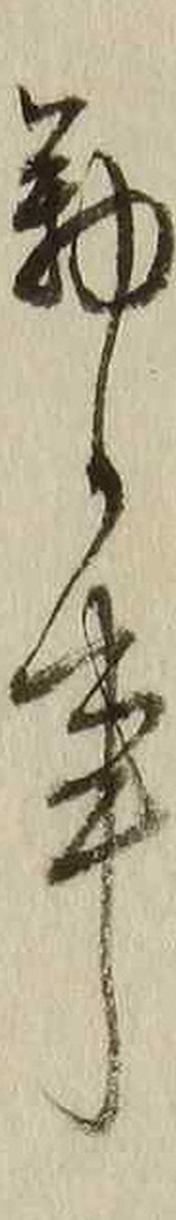勤候事
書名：諸士系譜　巻之38　は之部6
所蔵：会津若松市立会津図書館
